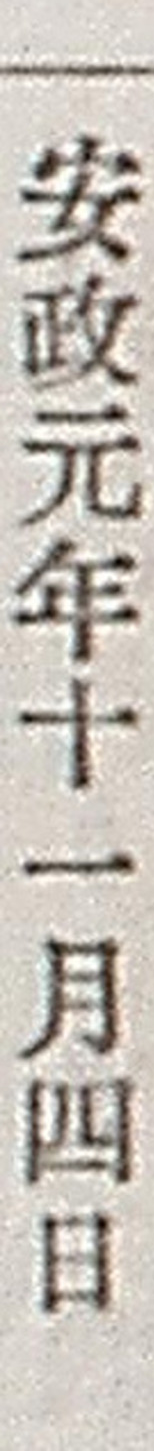安政元年十一月四日
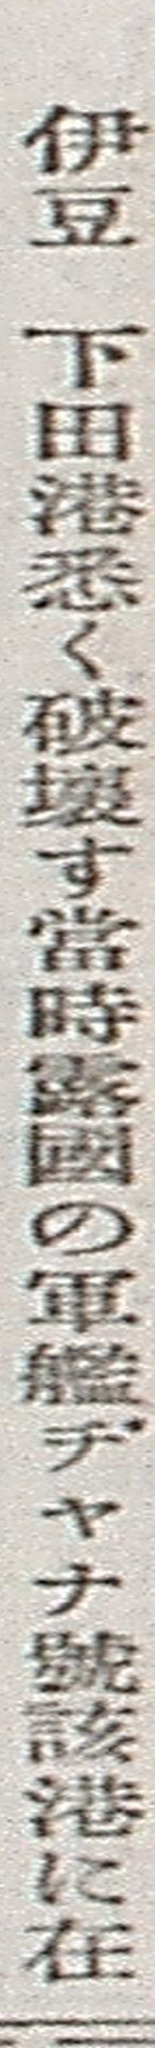伊豆下田港悉く破壊す当時露国の軍艦チャナ号該港に在

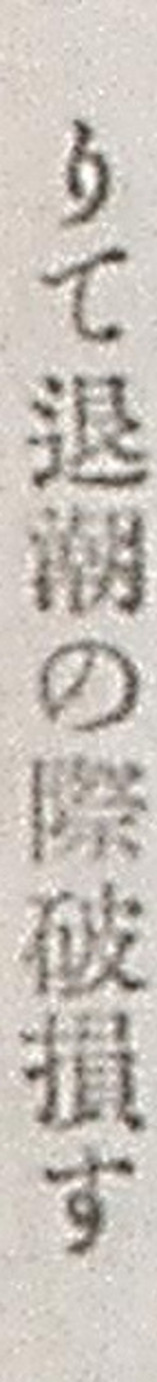りて退潮の際破損す
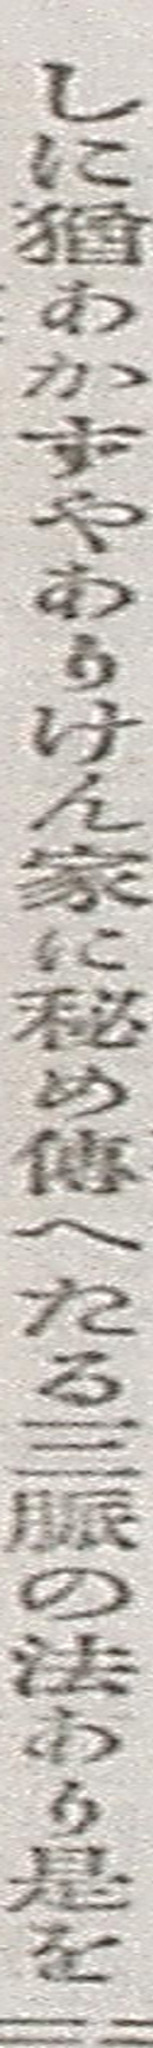しに猶あかずやありけん家に秘め伝へたる三脈の法あり是を
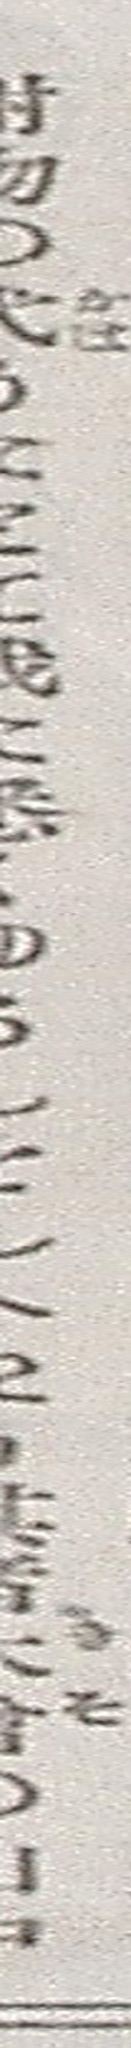謝物の代りにとて我に悉くゆるしをしへたり其者木曽の山中
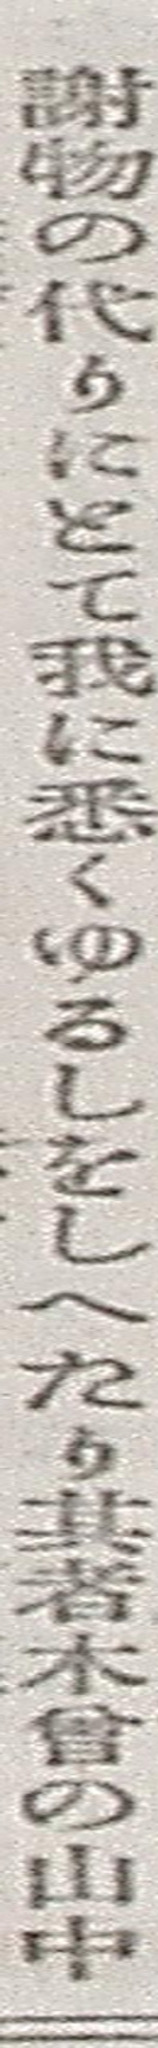謝物の代りにとて我に悉くゆるしをしへたり其者木曽の山中
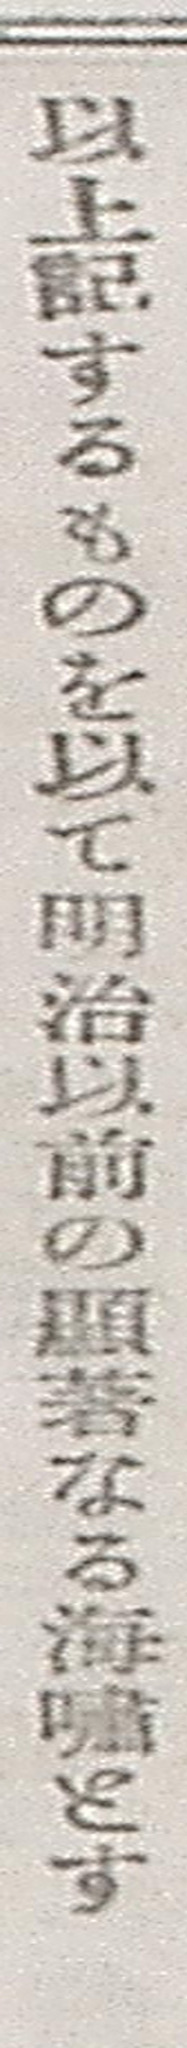以上記するものを以て明治以前の顕著なる海嘯とす
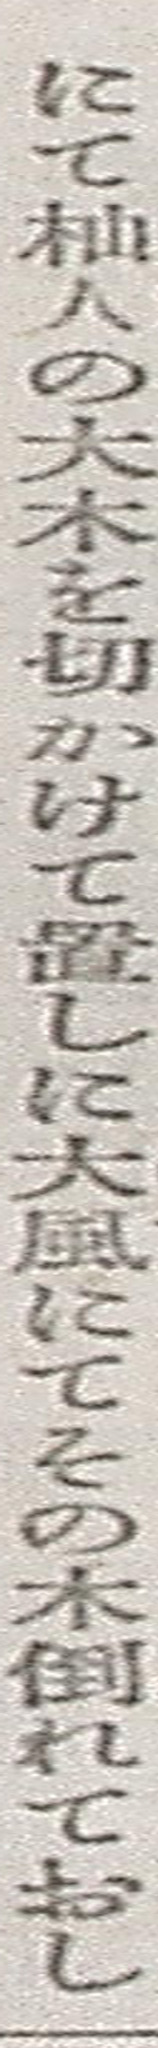にて杣人の大木を切かけて置しに大風にてその木倒れておし
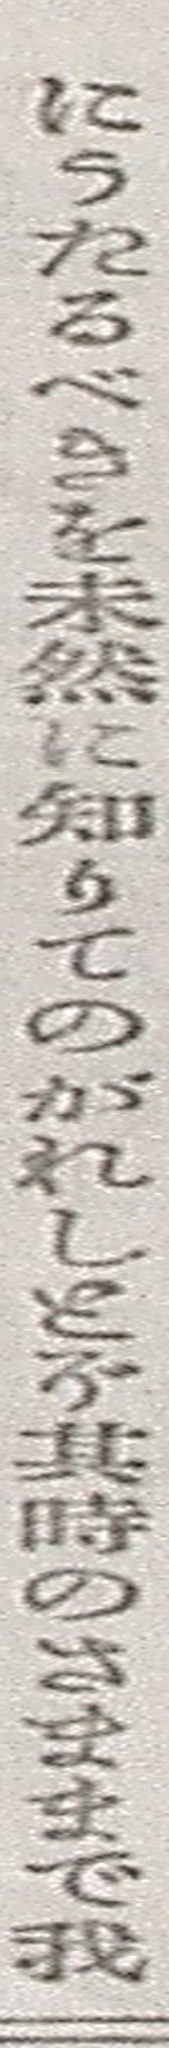にうたるべきを未然に知りてのおがれしとぞ其時のさままで我
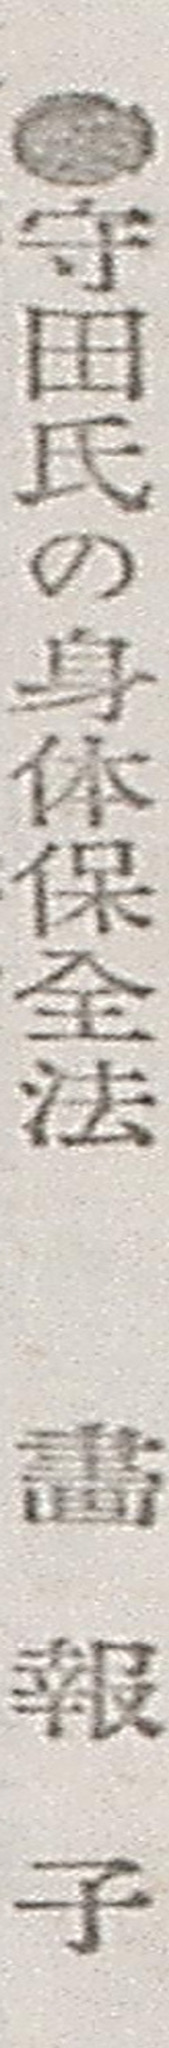●守田氏の身体保全法画報子
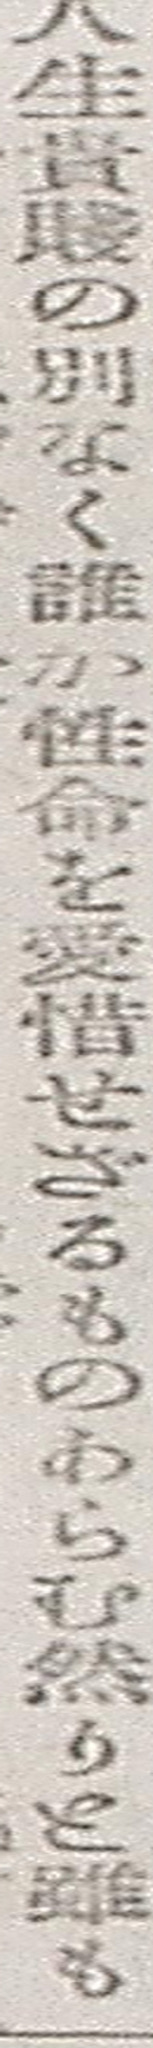人生貴賤の別なく誰か性命を愛惜せざるものあらむ然りと雖も
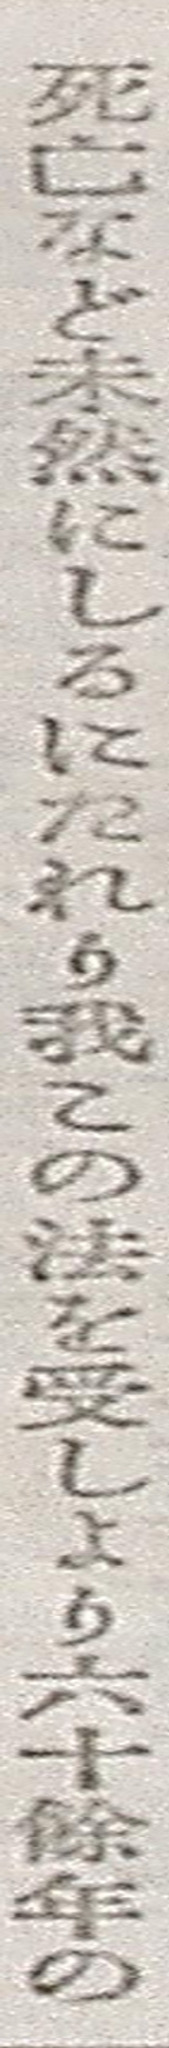死亡など未然にしるにたれり我この法を受しより六十余年の
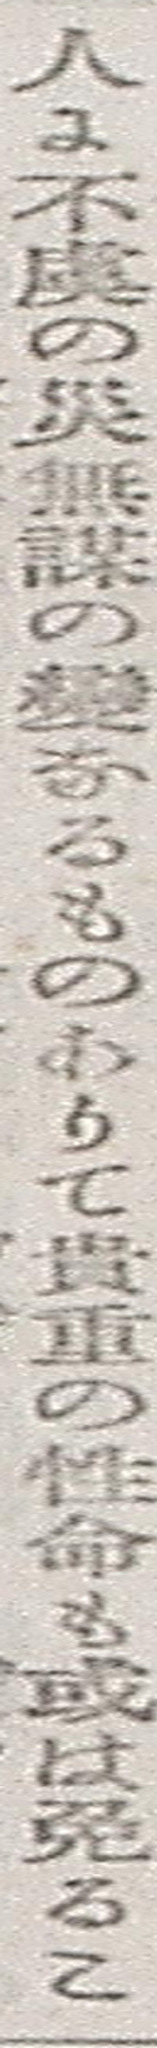人に不虞の災無謀の変なるものありて貴重の性命も或は免るこ
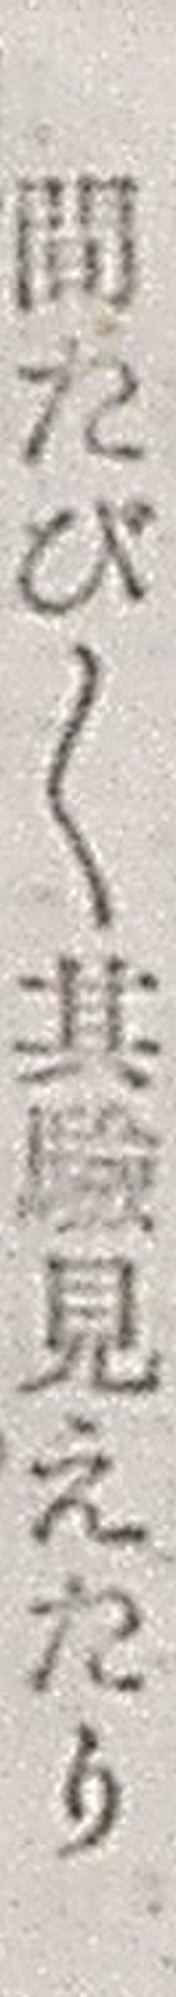間たび〳〵其験見えたり
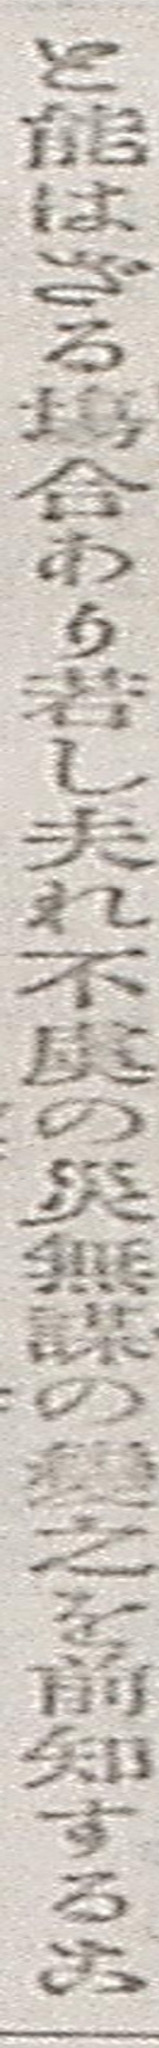と能はざる場合あり若し夫れ不虞の災無謀の変之を前知するこ
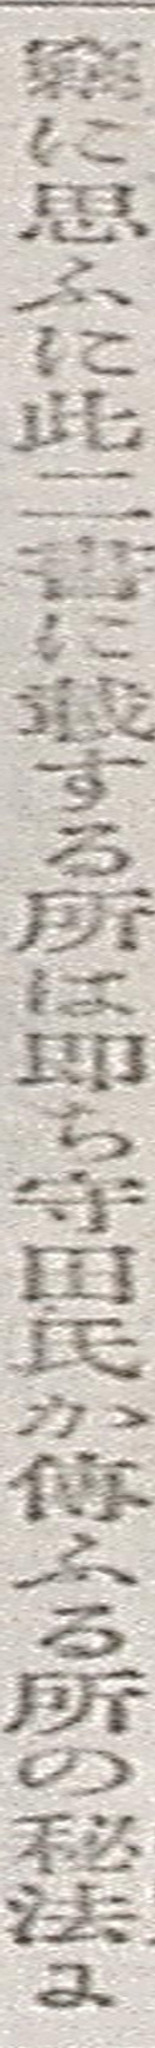竊に思ふに此二書に載する所は即ち守田氏か伝ふる所の秘法に
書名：風俗畫報臨時増刊第百二十號　大海嘯被害録（下）
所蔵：東京大学地震研究所図書室 Earthquake Research Institute Library, The University of Tokyo, JAPAN
